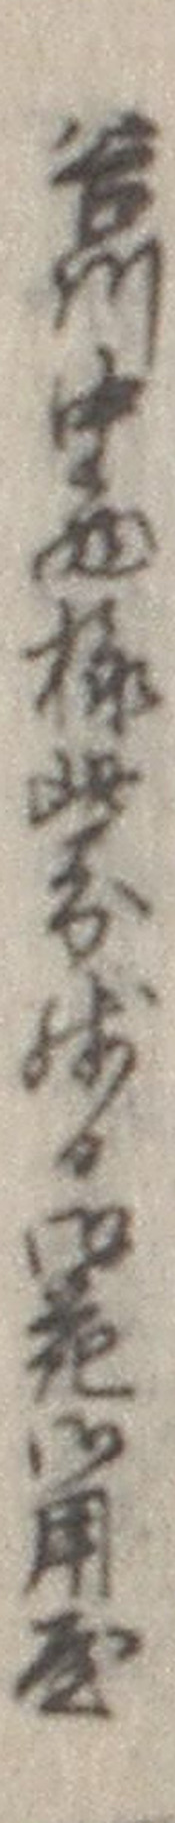谷川中西様此分残る御花御用屋
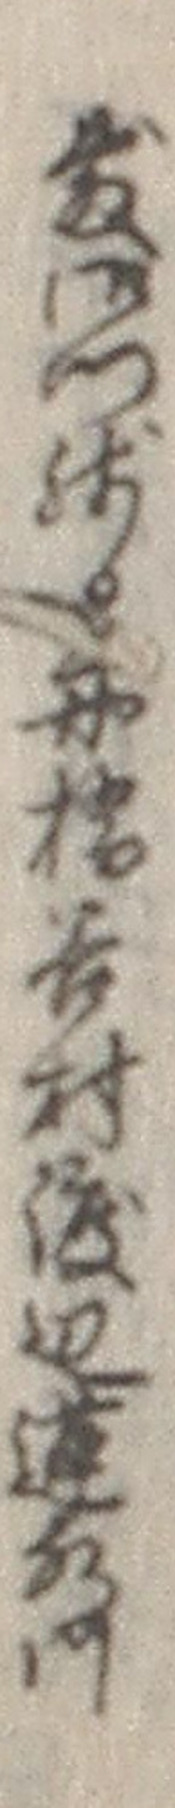敷御門残る舟橋谷村渡辺蓮水川
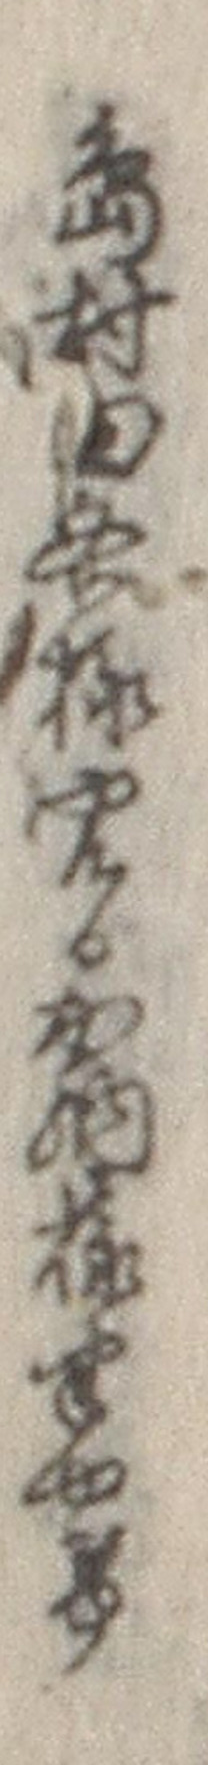島村田各様やける加納様半やける
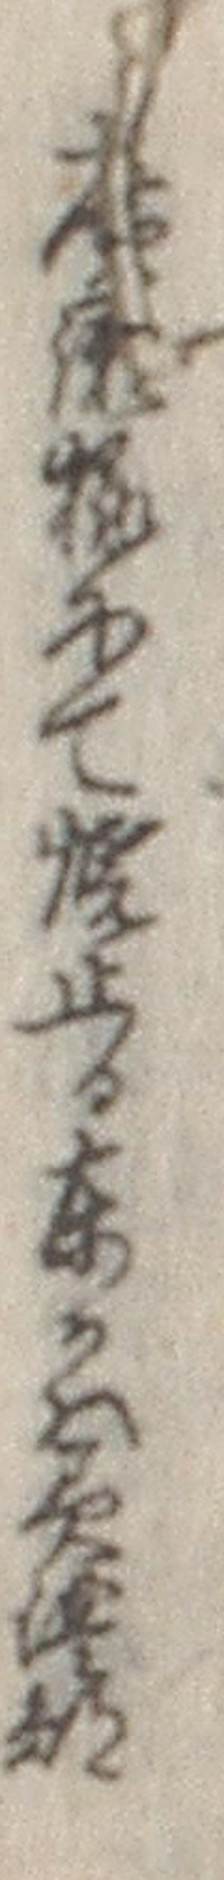廣瀬様にて焼止る東かは美濃頭
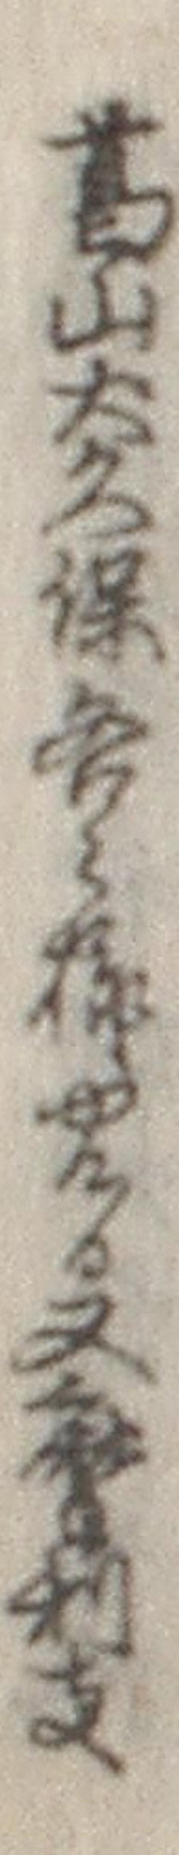葛山大久保各〻様やける又摩利支
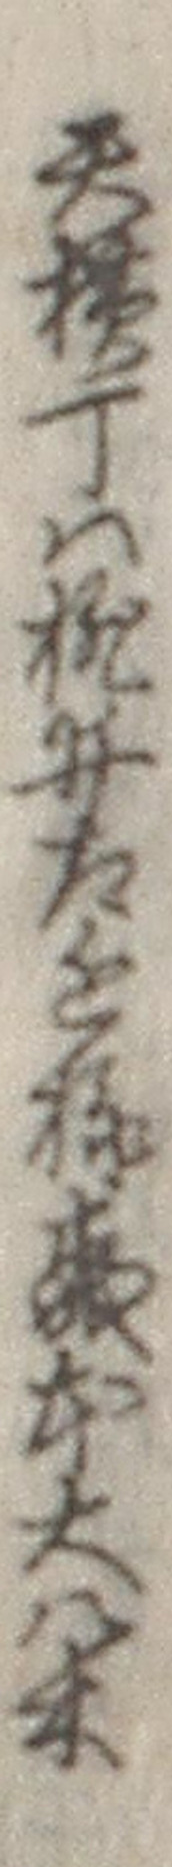天横丁は柳井右近様森本大八木
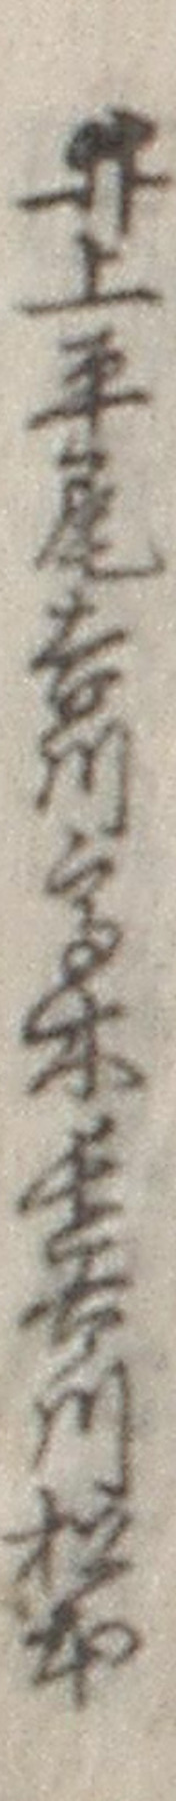井上平尾吉川富木長谷川松本
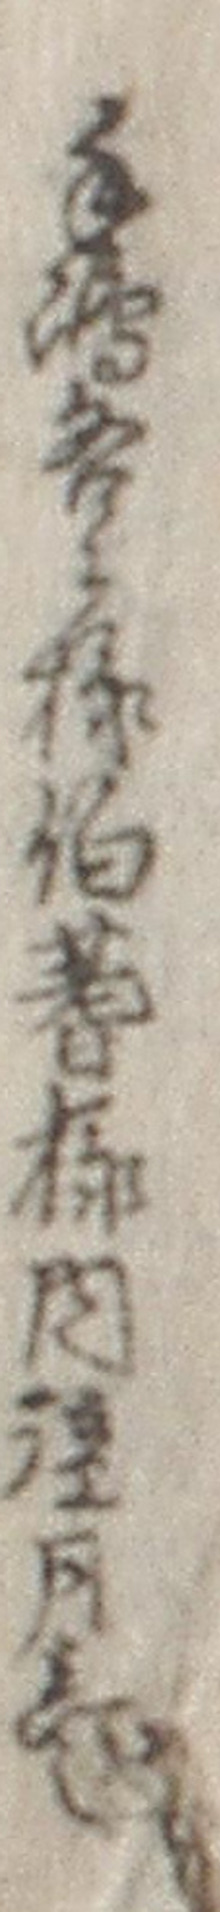手嶋各〻様伯耆様内窪月
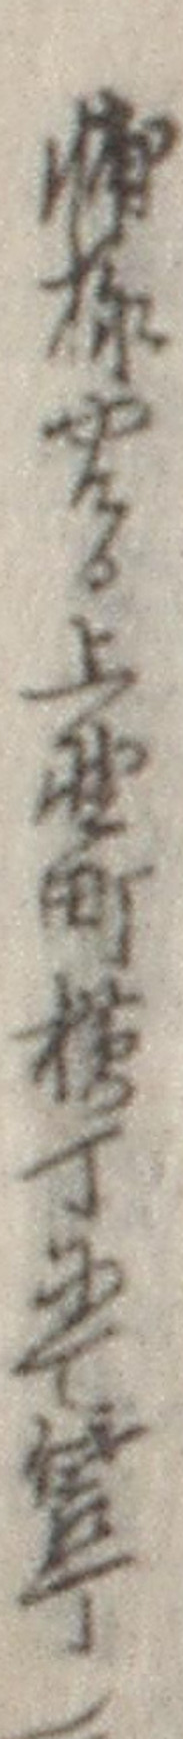浦様やける上野町横丁にて代？古？丁
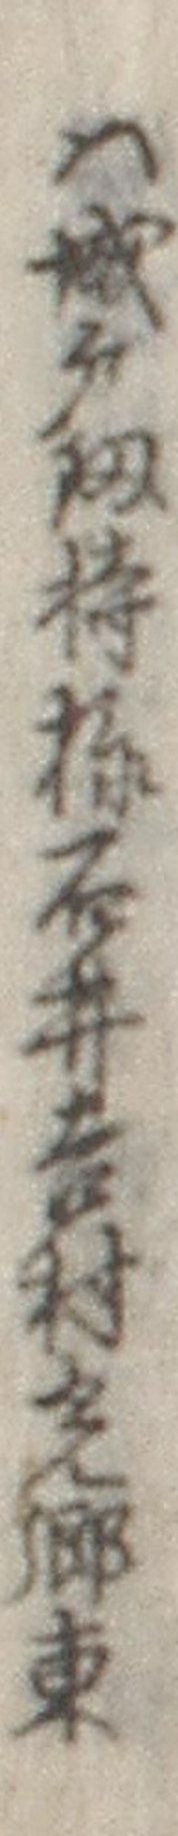は城戸剱持様石井吉村免郷東
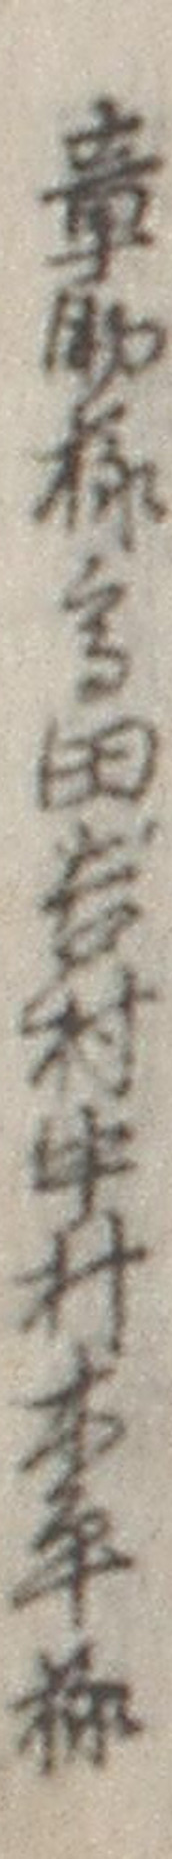章助様高田吉村中村木平様
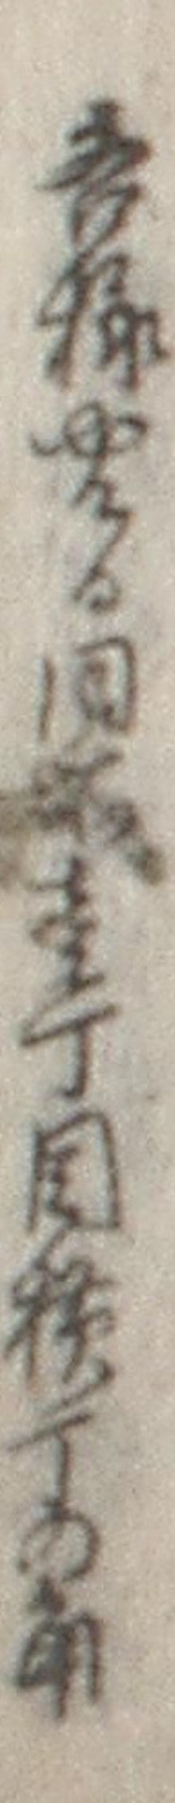各様やける同所壱丁目横丁の角
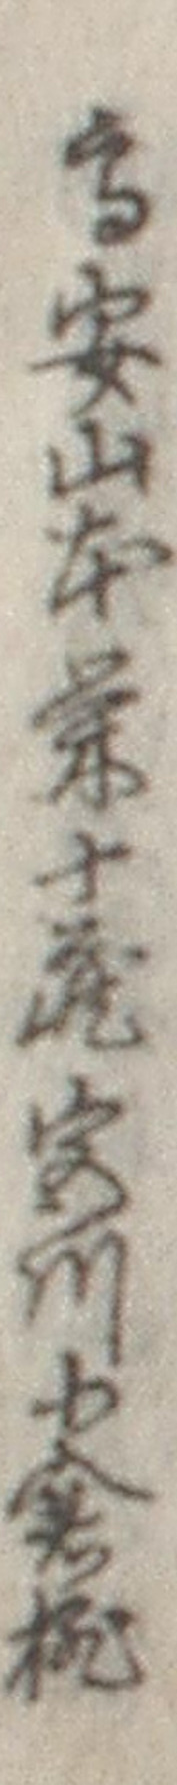高安山本栄十蔵宮川小倉柳
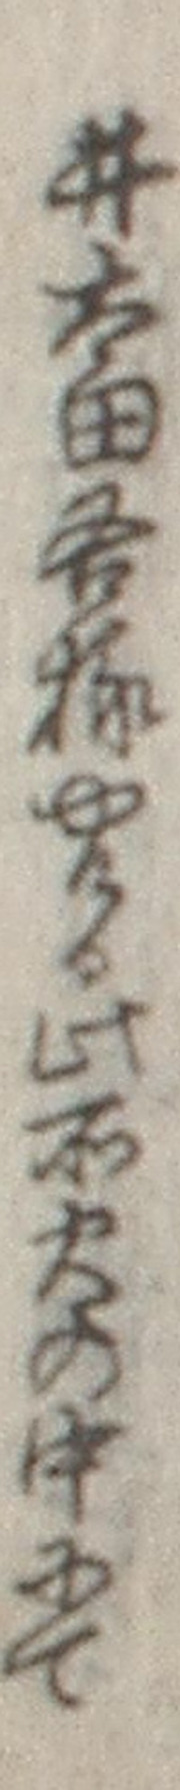井太田各様やける此所火の中にて
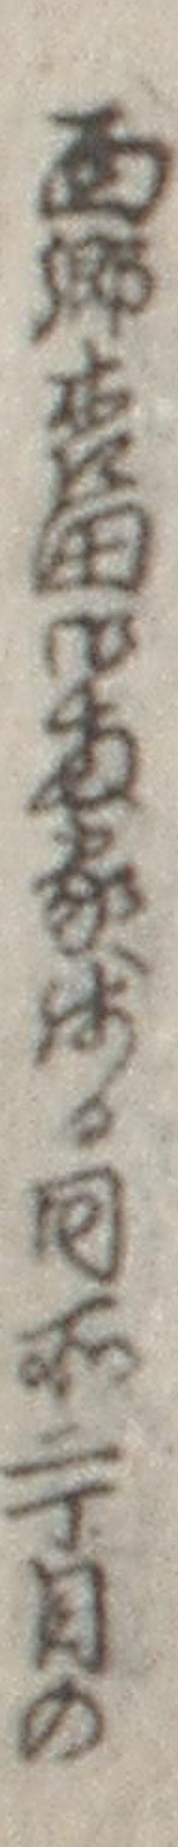西郷森田御両家残る同所二丁目の
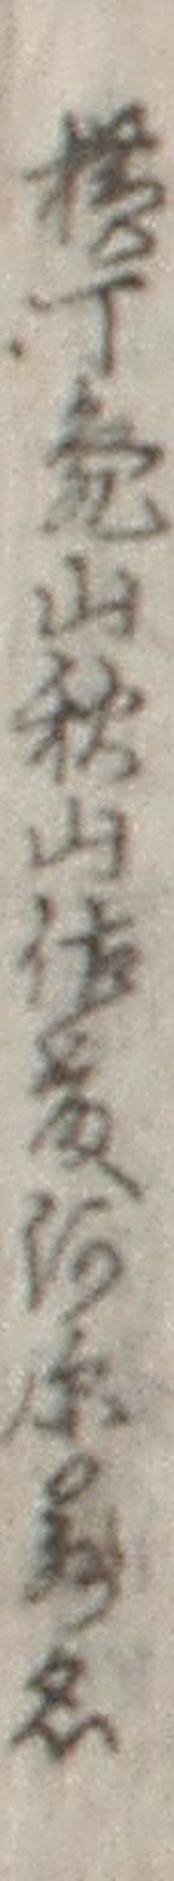横丁祭山秋山佐藤河原義名
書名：江戸　大地震臣細録　全
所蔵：東京大学地震研究所図書室 Earthquake Research Institute Library, The University of Tokyo, JAPAN
